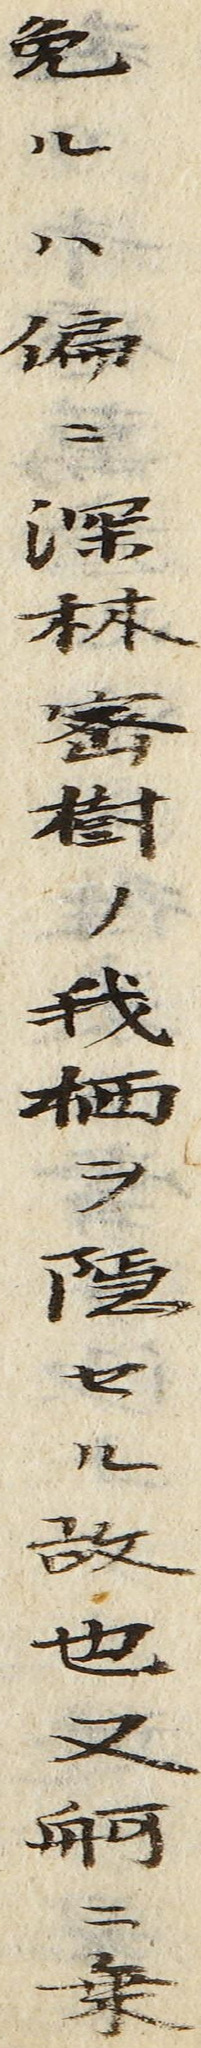免ルハ偏ニ深林密樹ノ我栖ヲ隠セル故也又舸ニ乗
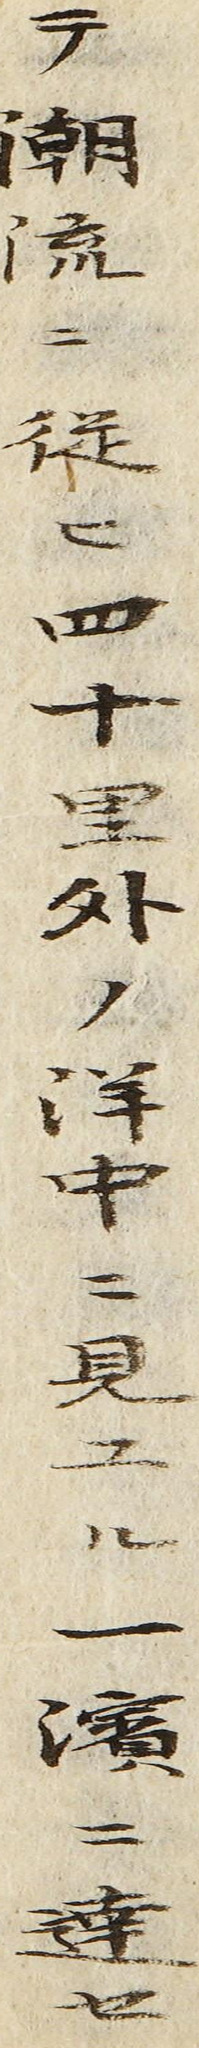テ潮流ニ従ヒ四十里外ノ洋中ニ見ユル一浜ニ達セ
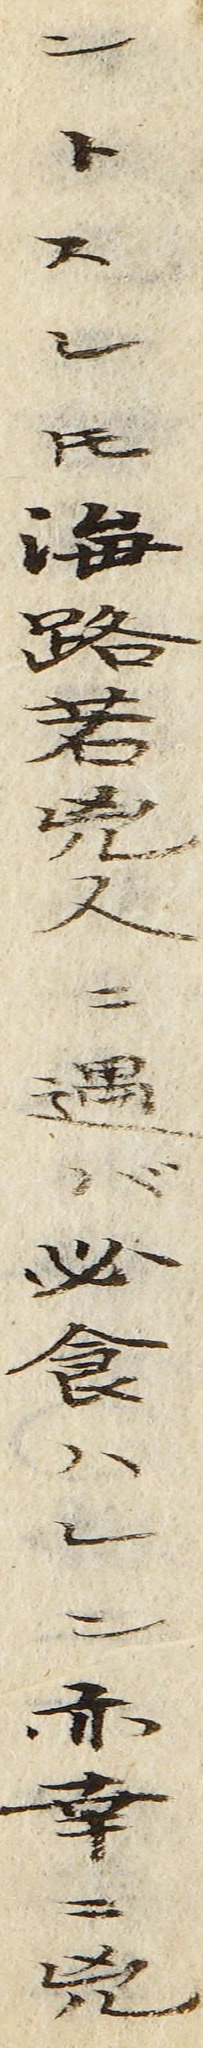ントスレトモ海路若兇人ニ遇バ必食ハレン亦幸ニ兇
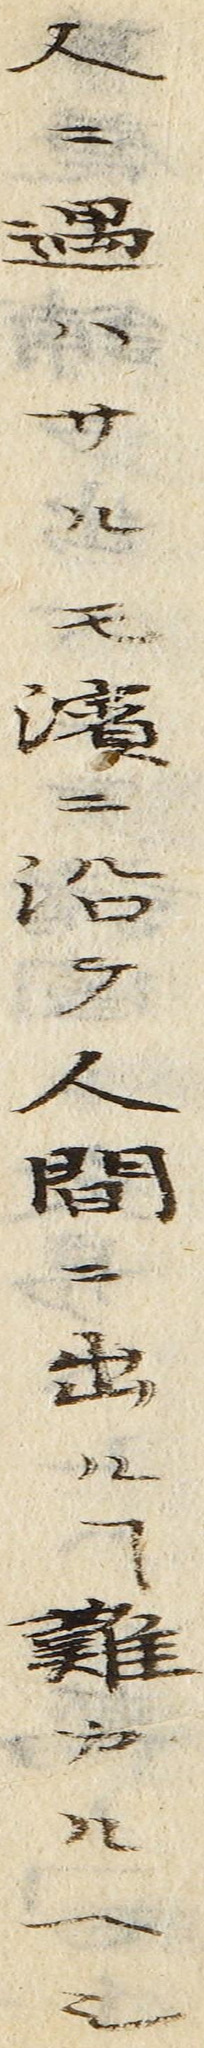人ニ遇ハサルモ浜ニ沿テ人間ニ出ルコト難カルヘシ
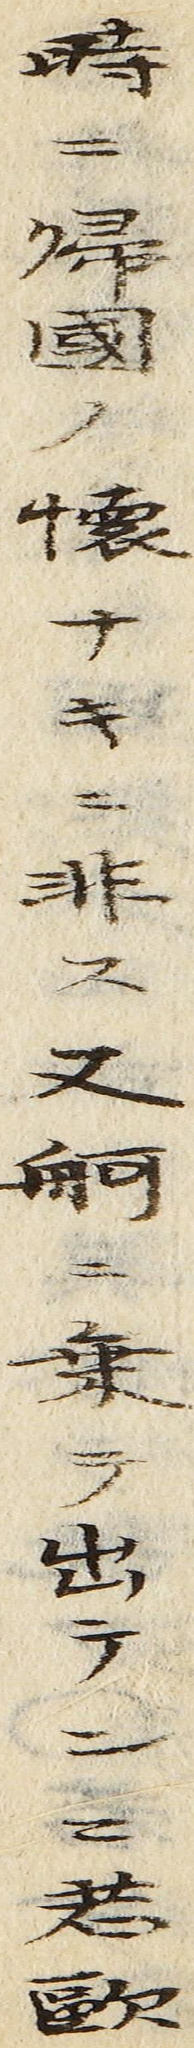時ニ帰国ノ懐ナキニ非ス又舸ニ乗テ出テンニ若欧
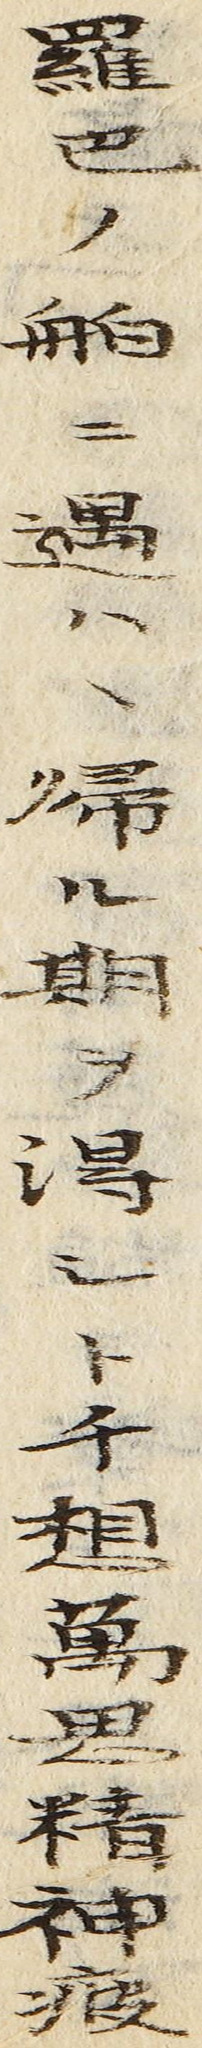羅巴ノ舶ニ遇ハヽ帰ル期ヲ得シト千想萬思精神疲
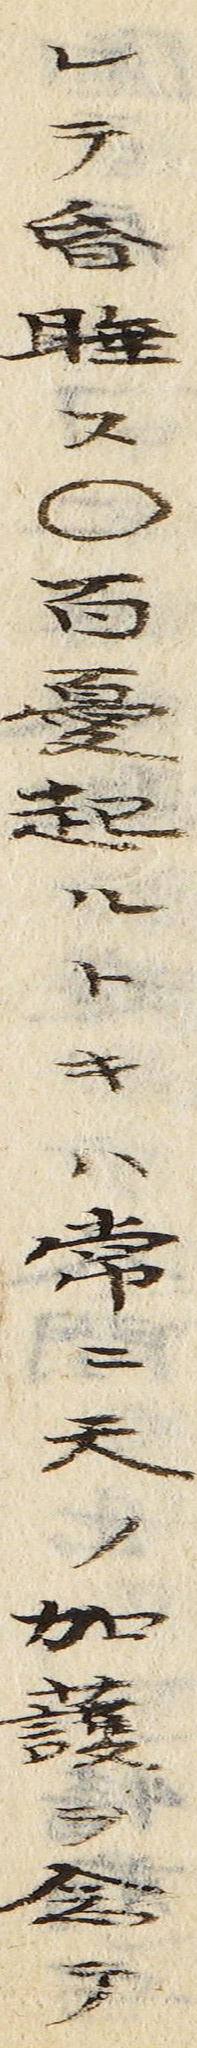レテ昏睡ス◯百憂起ルトキハ常ニ天ノ加護ヲ念テ
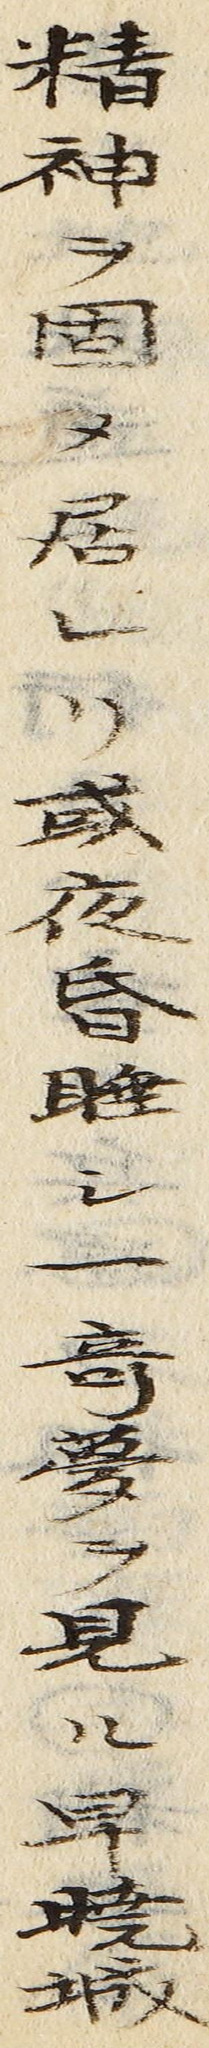精神ヲ固メ居レリ或夜昏睡シ一奇夢ヲ見ル早暁城
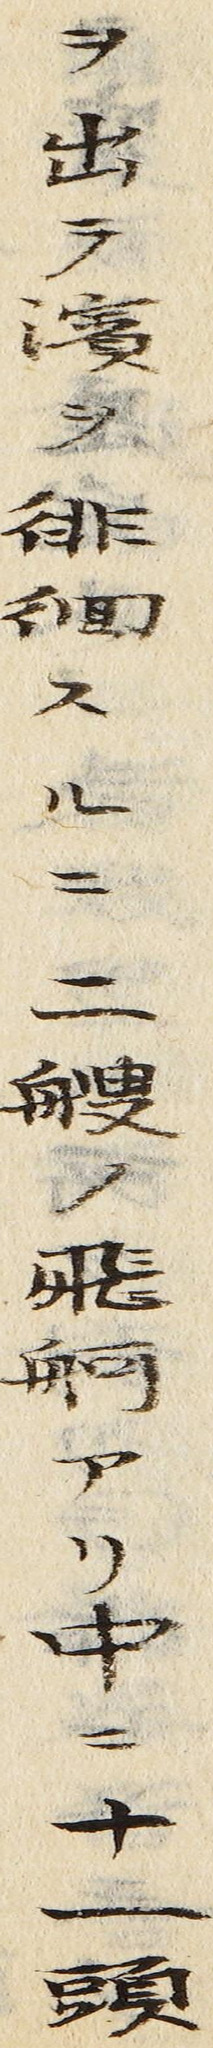ヲ出テ浜ヲ徘徊スルニ二艘ノ飛舸アリ中ニ十一頭
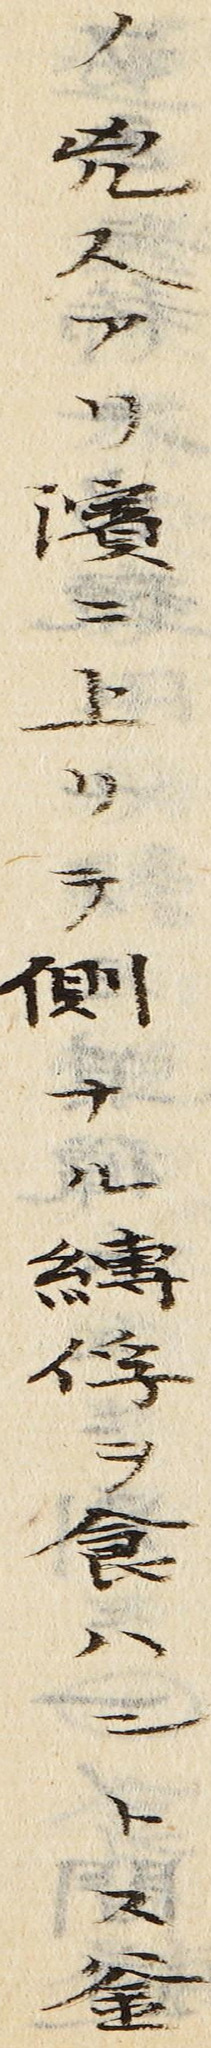ノ兇人アリ浜ニ上リテ側ナル縛俘ヲ食ハントス釜
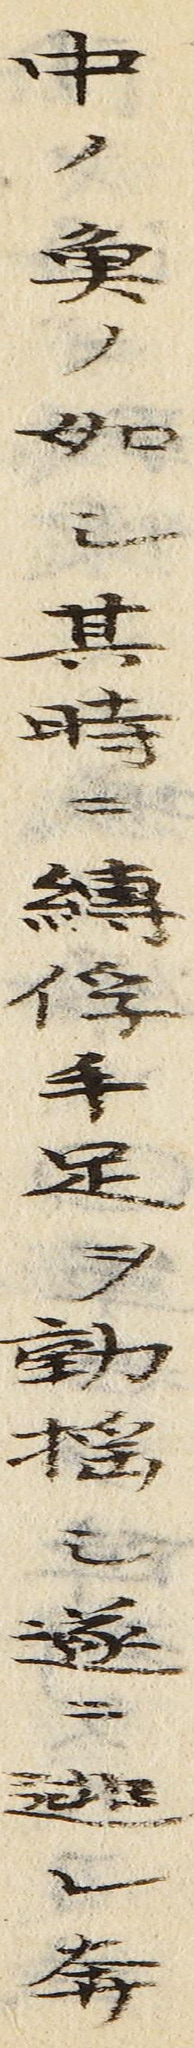中ノ魚ノ如シ其時ニ縛俘手足ヲ動揺シ遂ニ逃レ奔
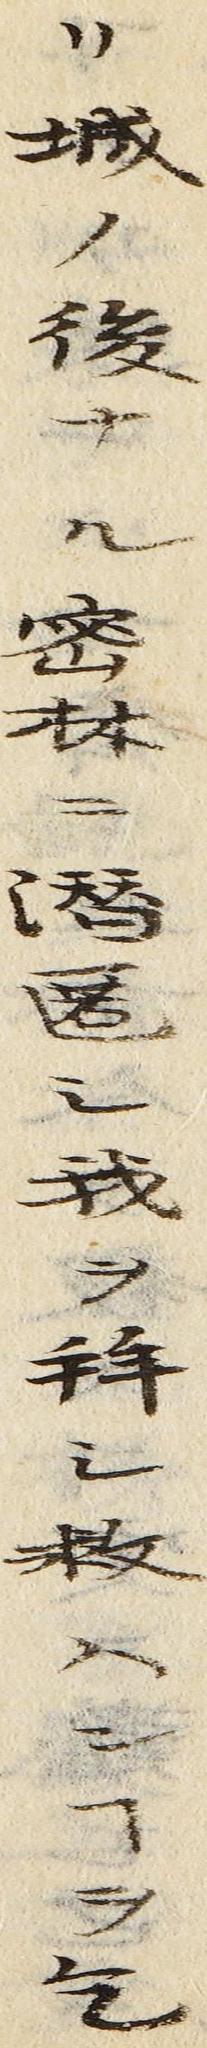リ城ノ後ナル密林ニ潜匿シ我ヲ拝シ救ハンコトヲ乞
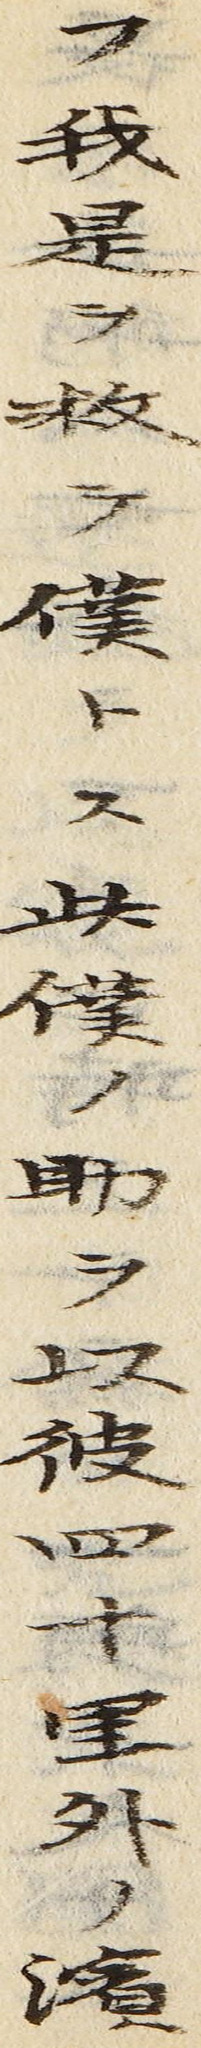フ我是ヲ救テ僕トス此僕ノ助ヲ以彼四十里外ノ浜
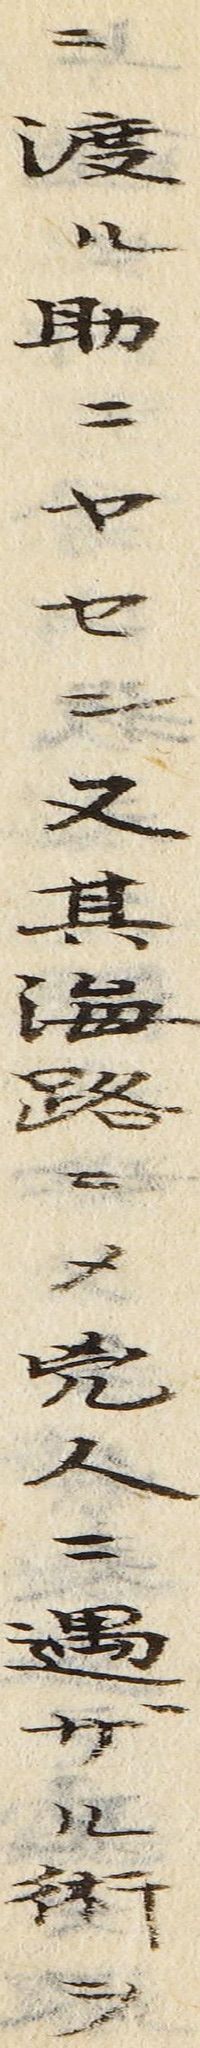ニ渡ル助ニヤセン又其海路ニシテ兇人ニ遇ザル術ヲ
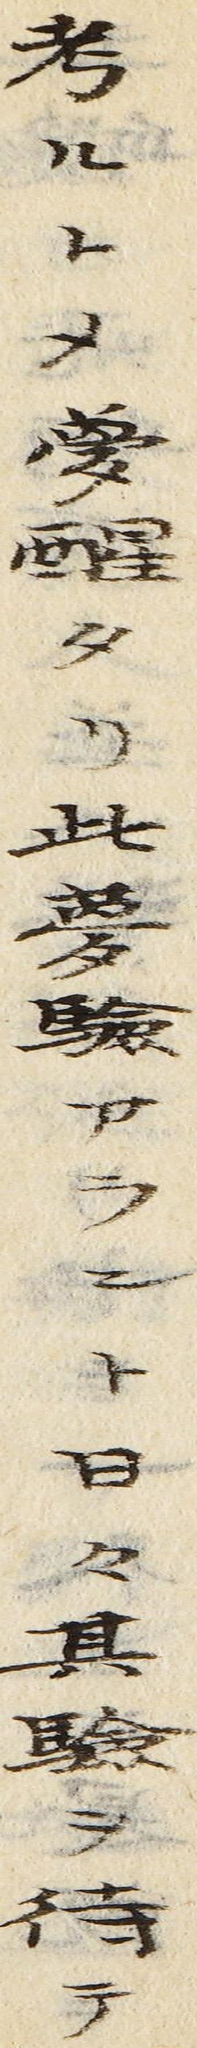考ルトシテ夢醒タリ此夢験アラント日々其験ヲ待テ
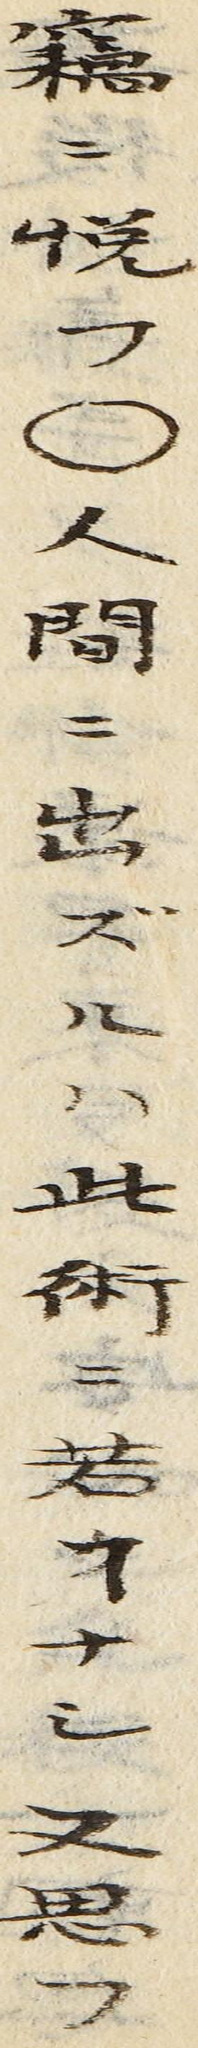竊ニ悦フ◯人間ニ出ズルハ此術ニ若コトナシ又思フ
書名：漂流紀事
